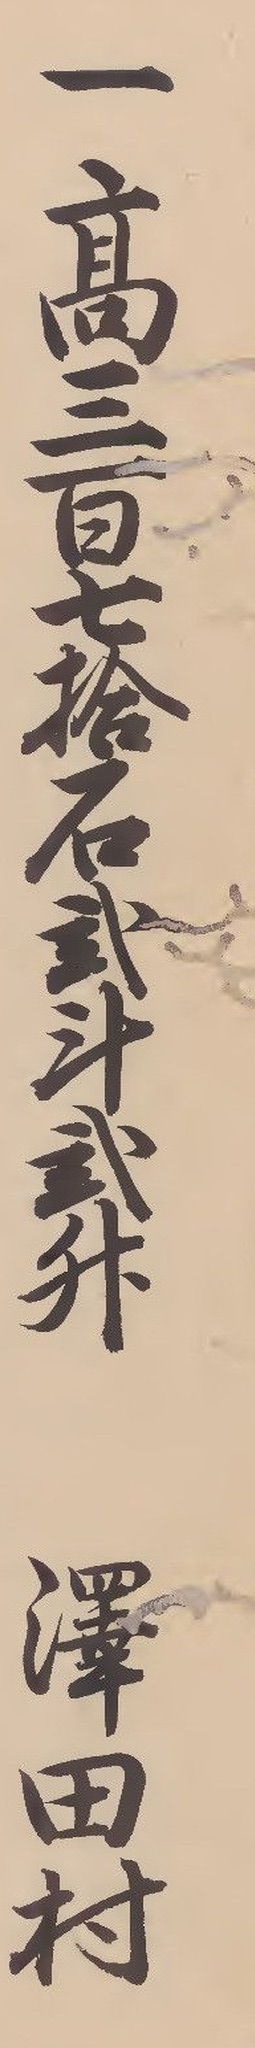一高三百七拾石弐斗弐升沢田村
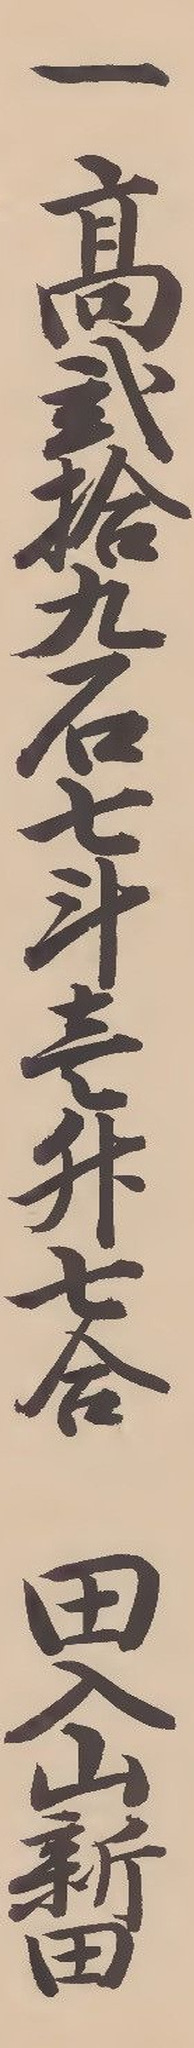一高弐拾九石七斗壱升七合田入山新田
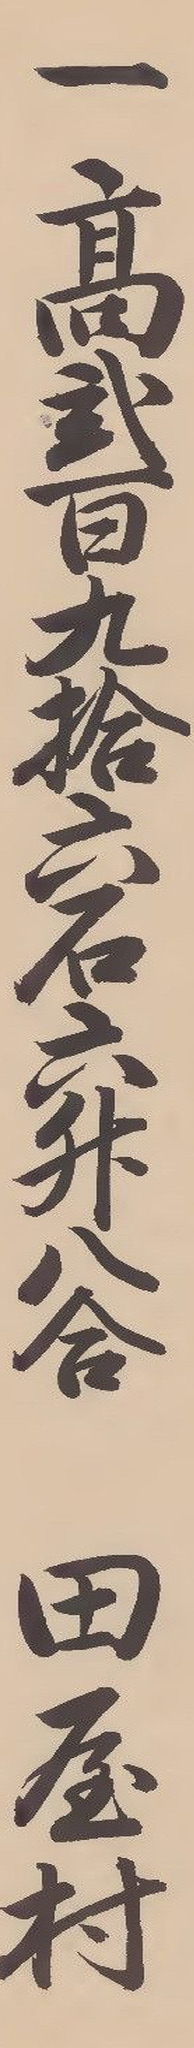一高弐百九拾六石六升八合田屋村
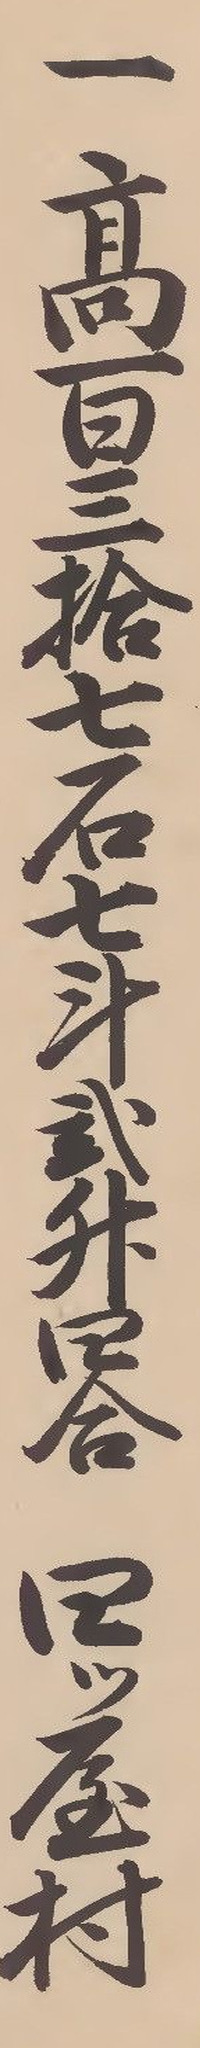一高百三拾七石七斗弐升四合四ツ屋村
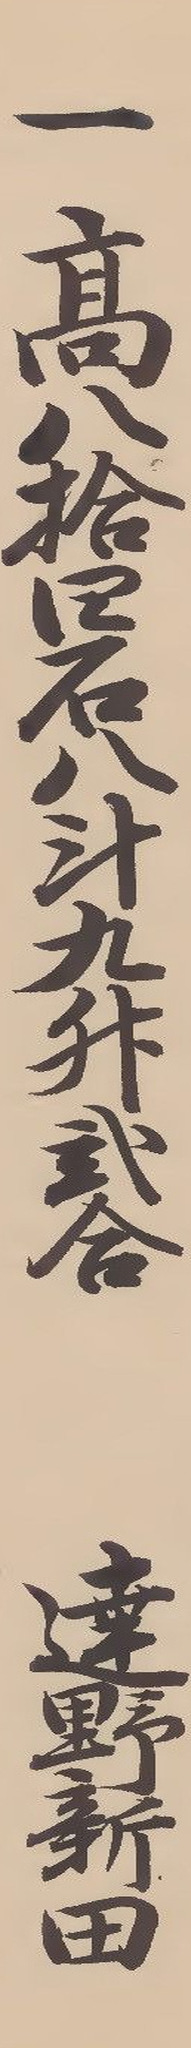一高八拾四石八斗九升弐合達野新田
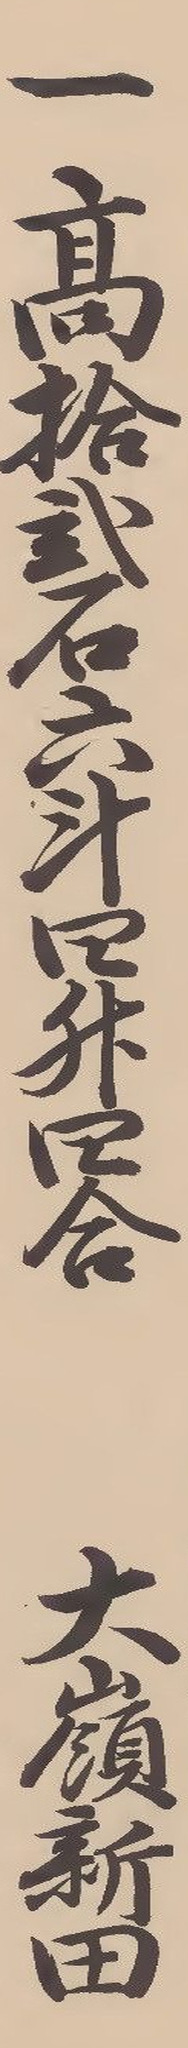一高拾弐石六斗四升四合大嶺新田
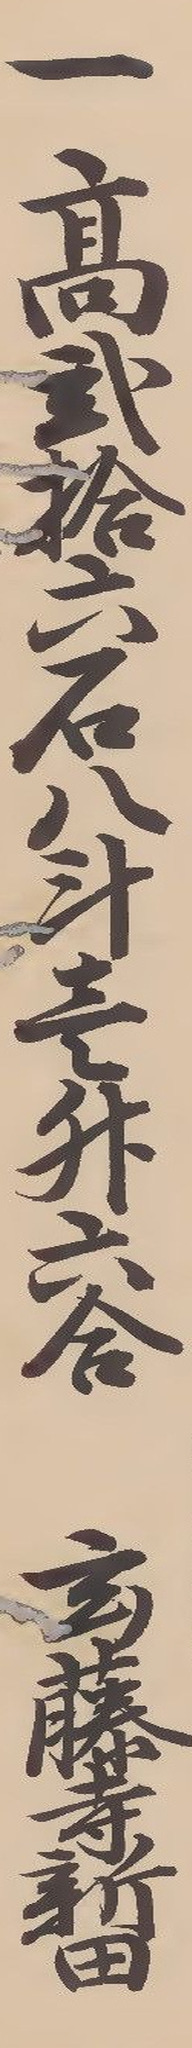一高弐拾六石八斗壱升六合玄藤寺新田

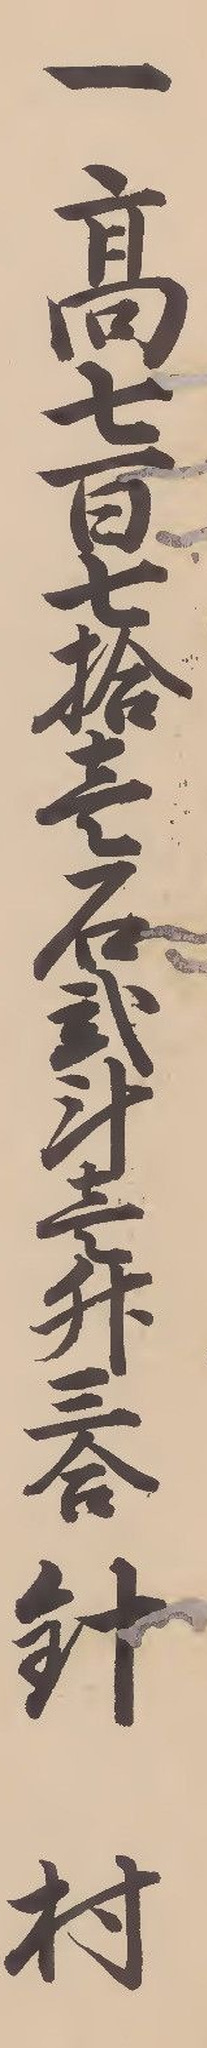一高七百七拾壱石弐斗壱升三合針村
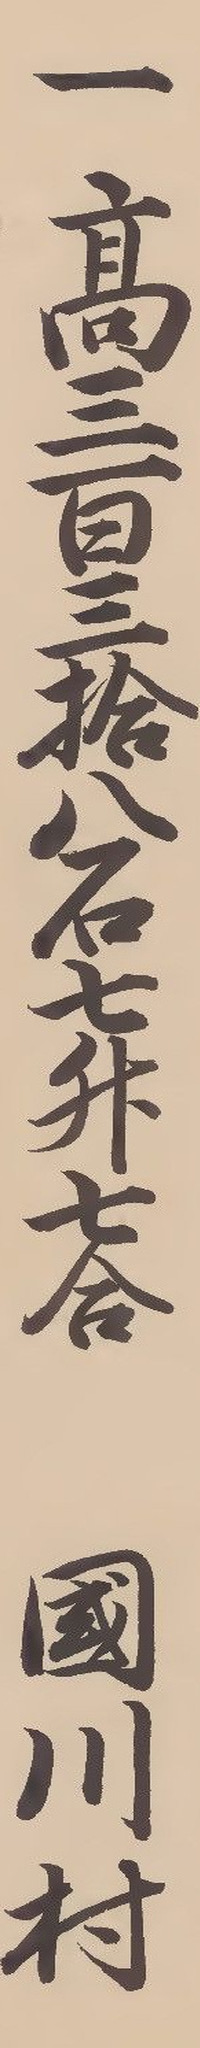一高三百三拾八石七升七合国川村
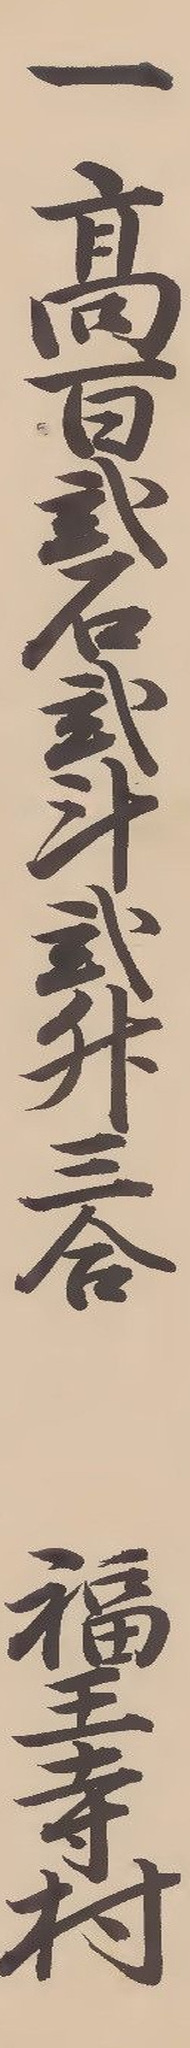一高百弐石弐斗弐升三合福王寺村
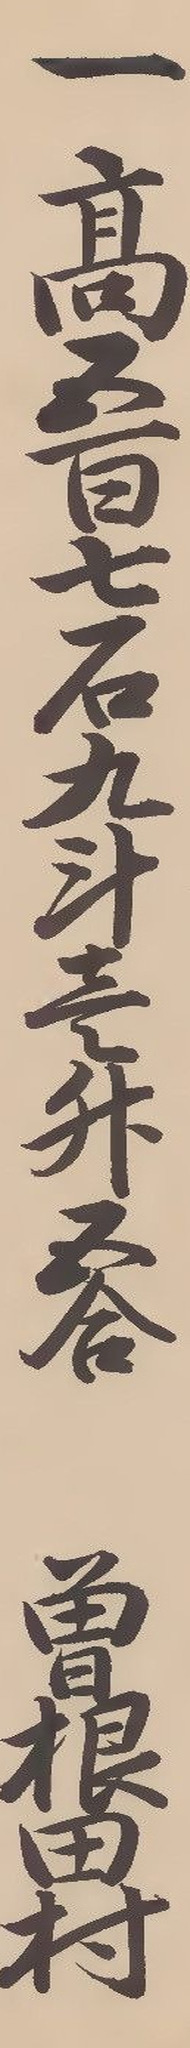一高五百七石九斗壱升五合曽根田村
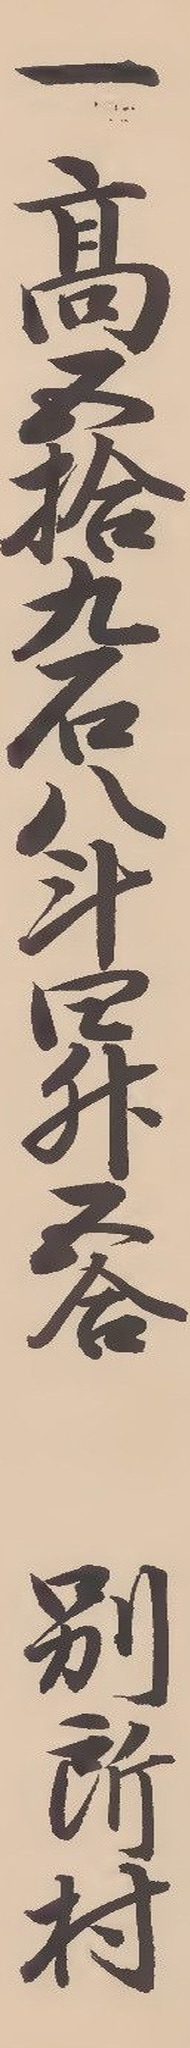一高五拾九石八斗四升五合別所村
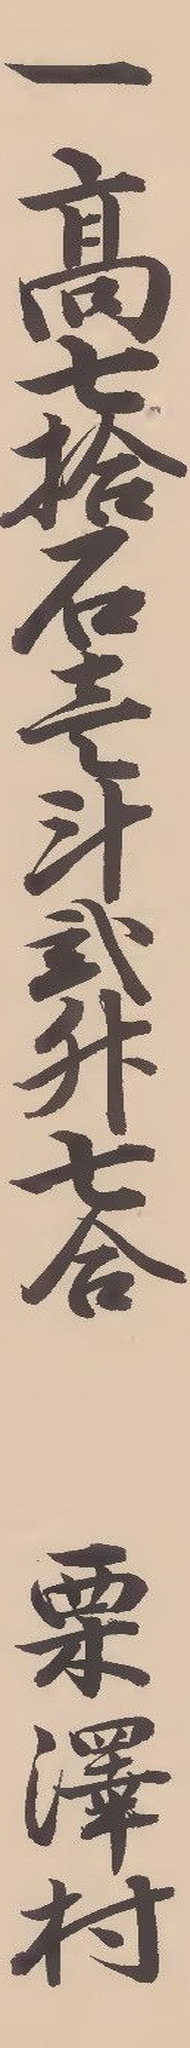一高七拾石壱斗弐升七合栗沢村
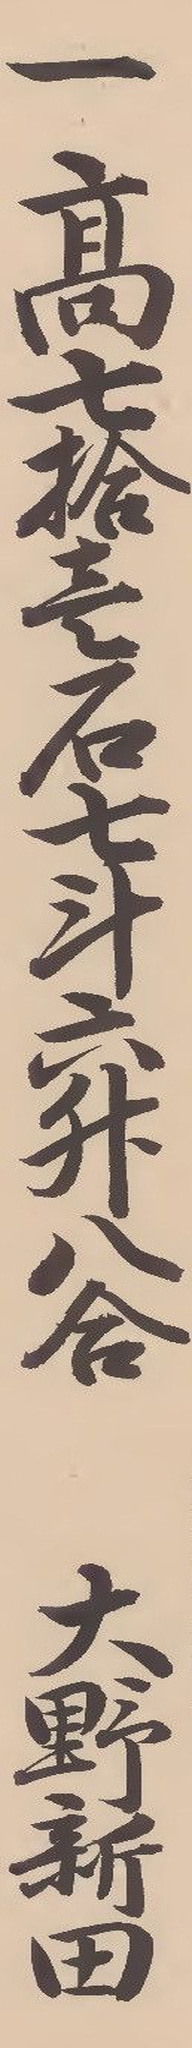一高七拾壱石七斗六升八合大野新田
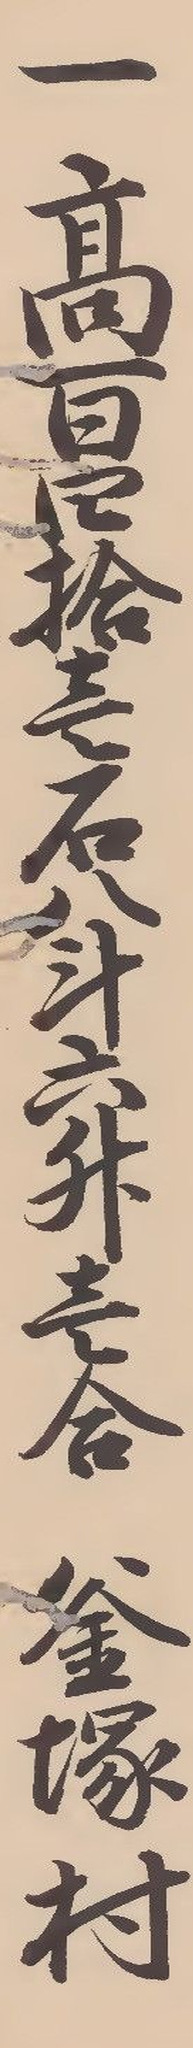一高百四拾壱石八斗六升壱合釜塚村

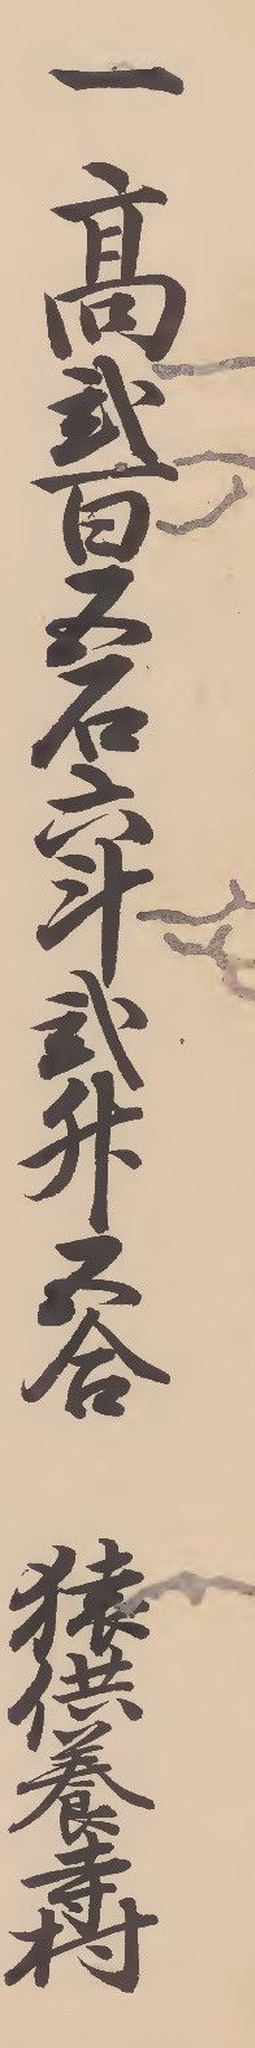一高弐百五石六斗弐升五合猿供養寺村
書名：越後国郷帳　上
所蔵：国立公文書館 National Archives of Japan
